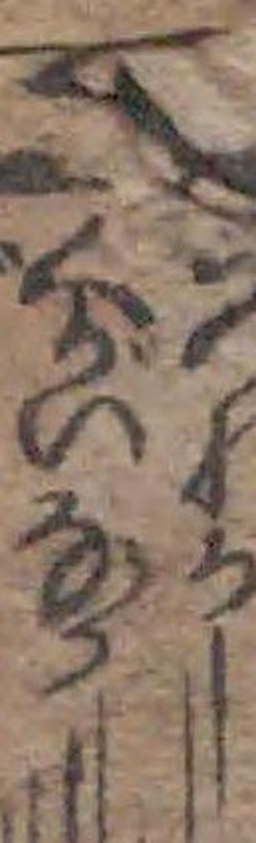くがいなら
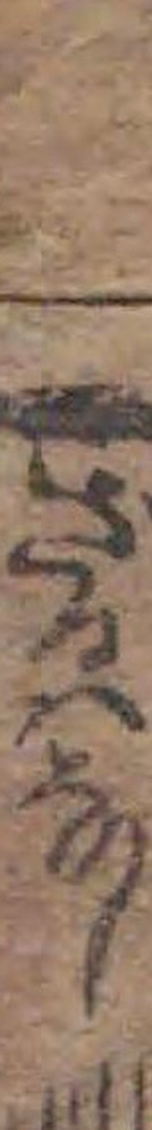ざるはなし
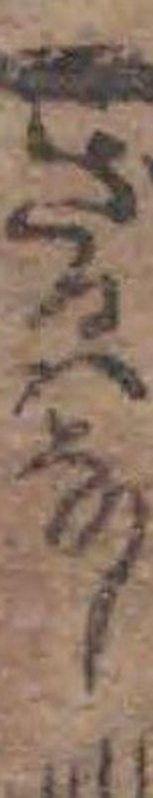ざるはなし
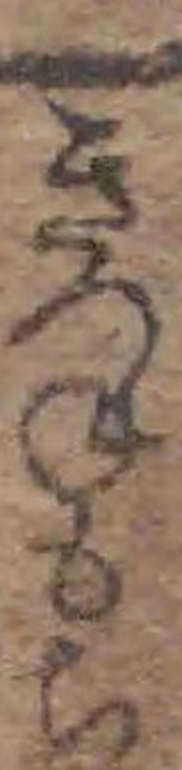きつねもち
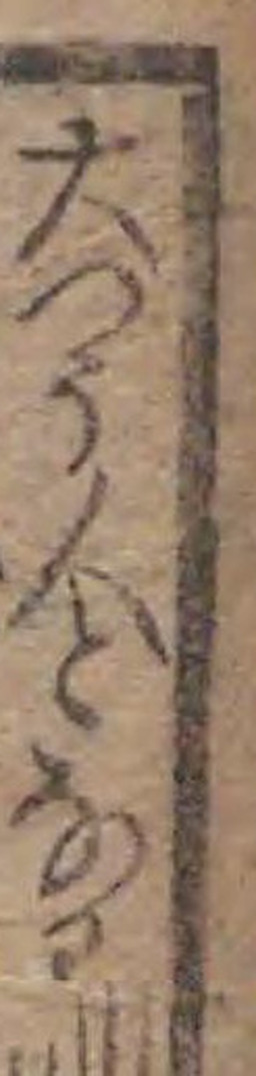大つう人となる
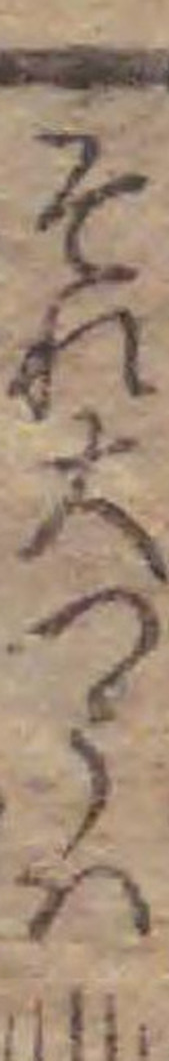それ大つうは
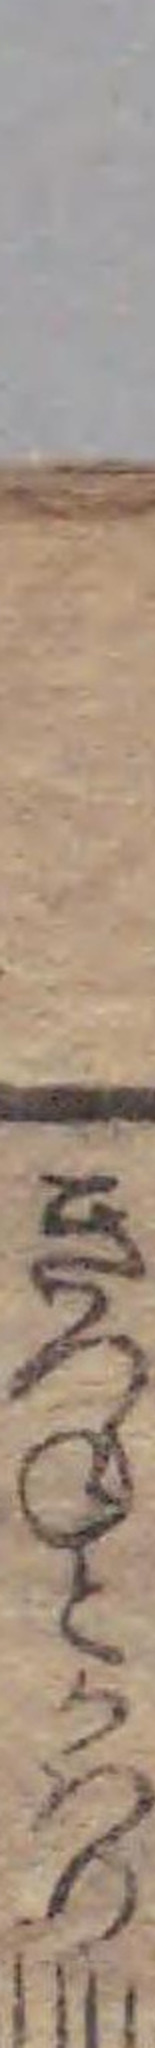きつねとかはり
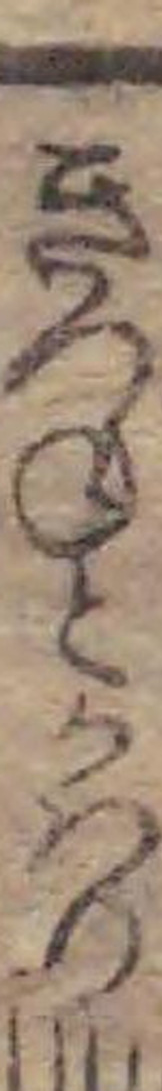きつねとかはり
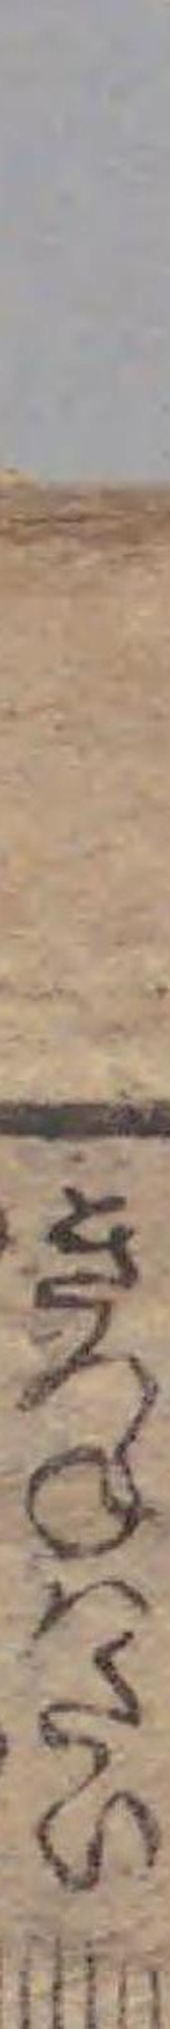きつねはたい
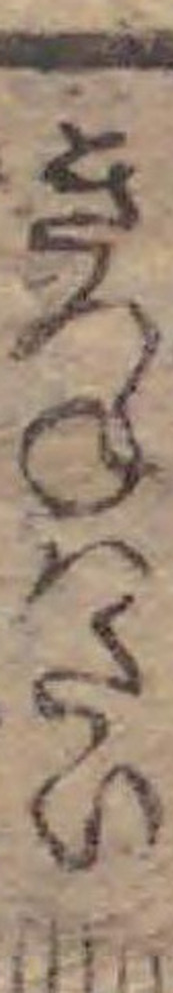きつねはたい
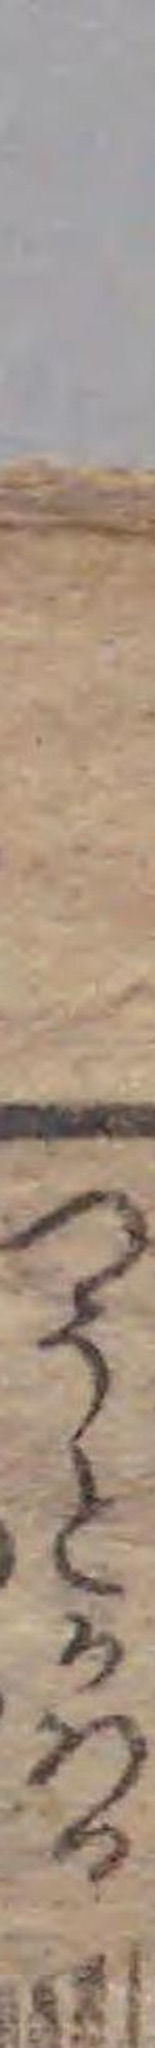つうとかはる
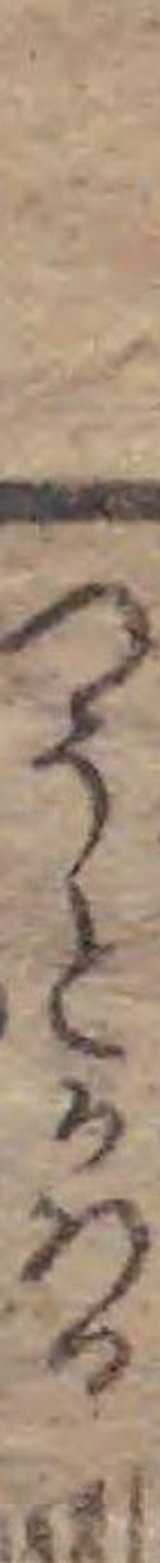つうとかはる
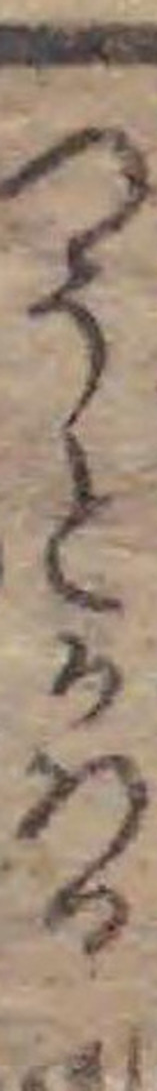つうとかはる
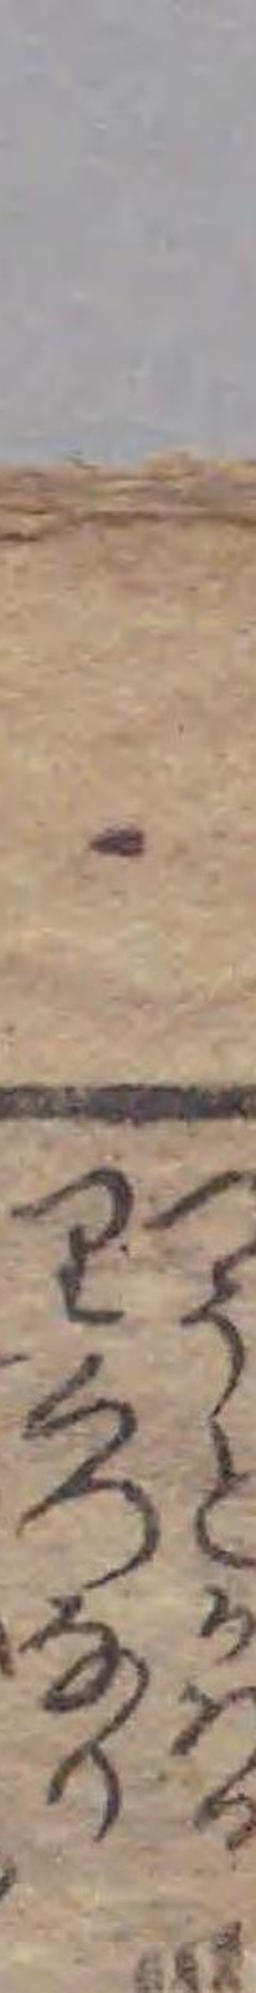りくつなり
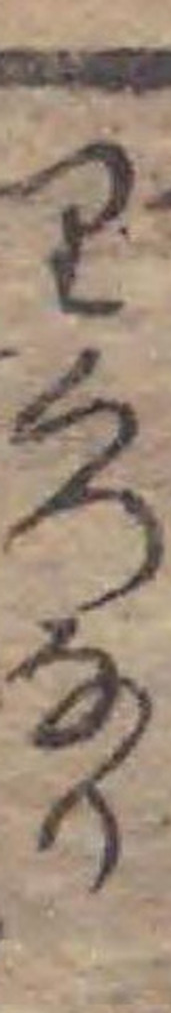りくつなり
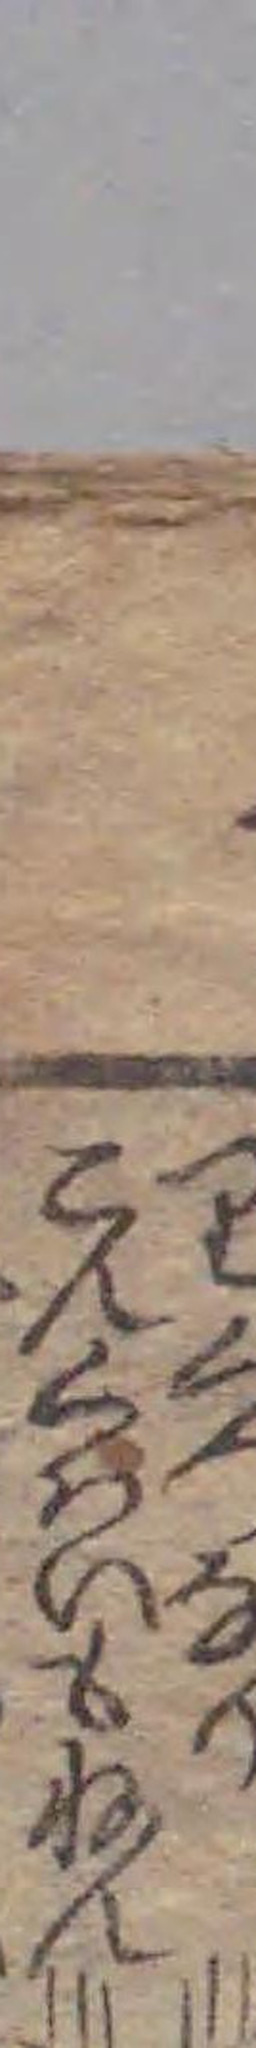こんくはいもねん
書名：化物楽屋異牒 : 2巻
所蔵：国立国会図書館 National Diet Library, JAPAN
